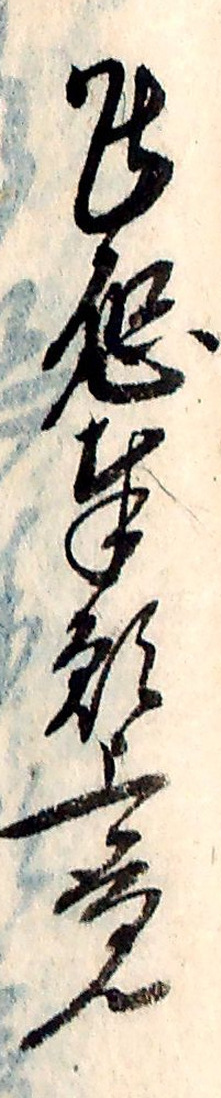乍恐奉願上候覚
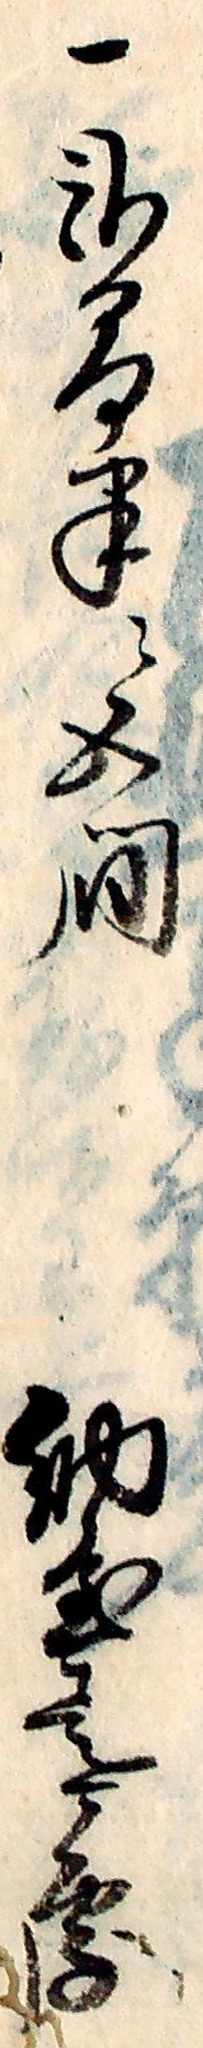一弐間半に五間納屋壱ヶ処
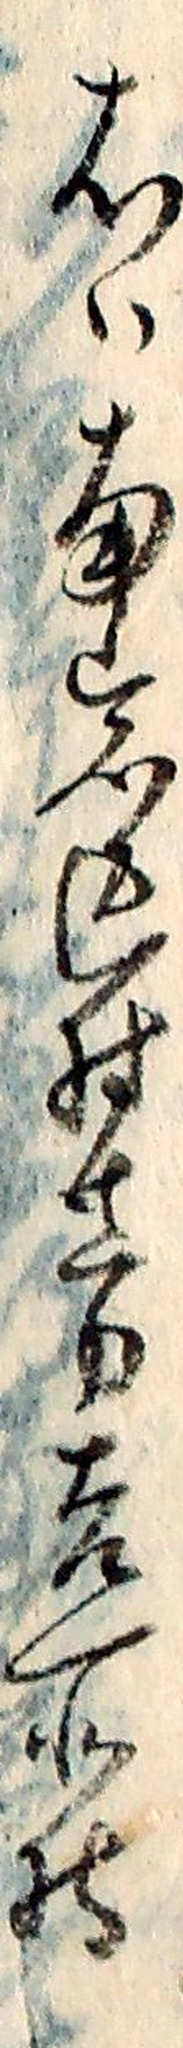右は南岩延村芳吉所持
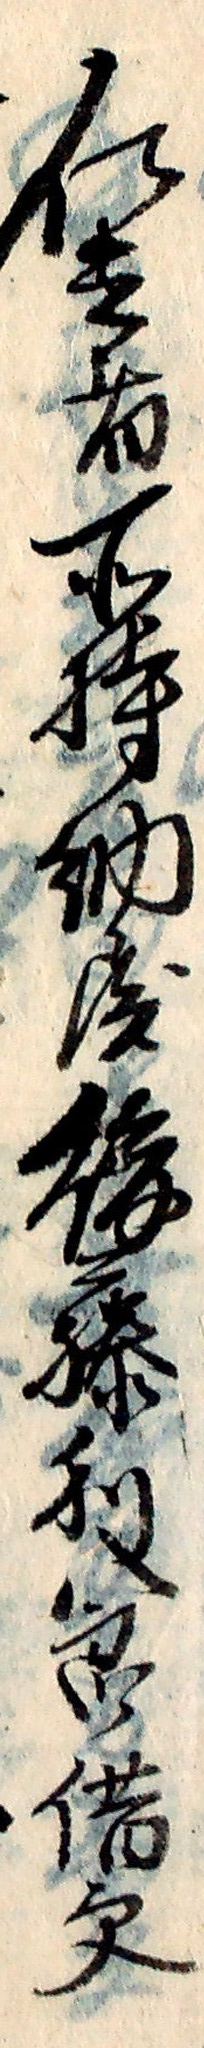右之者所持納屋後藤利八郎借受
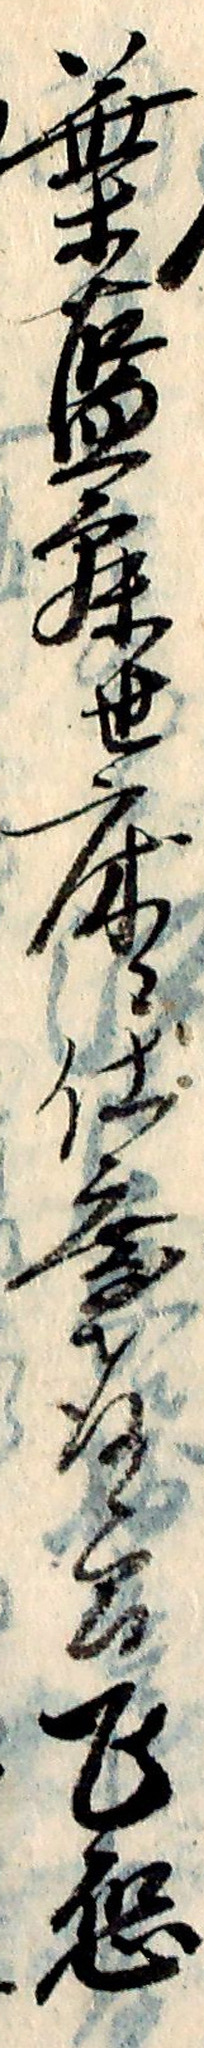葉藍寐せ床に仕度奉存候間乍恐
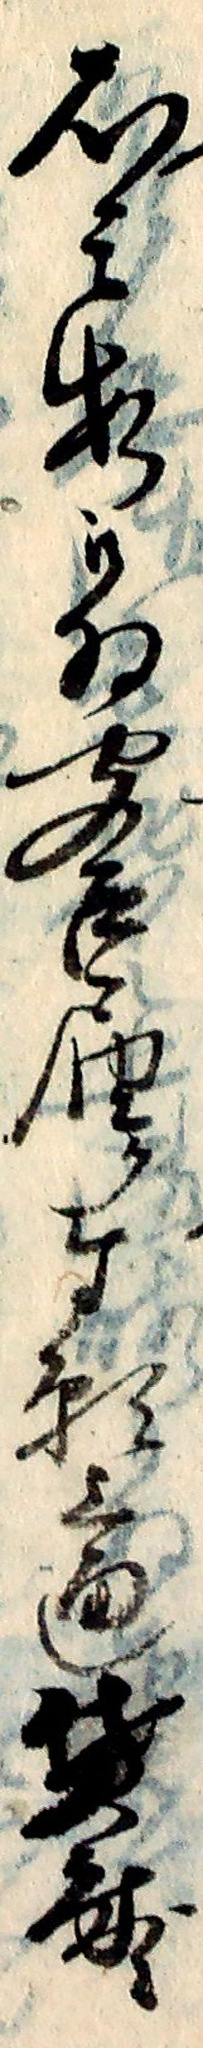右之段被為聞召届け奉願上通貸床に
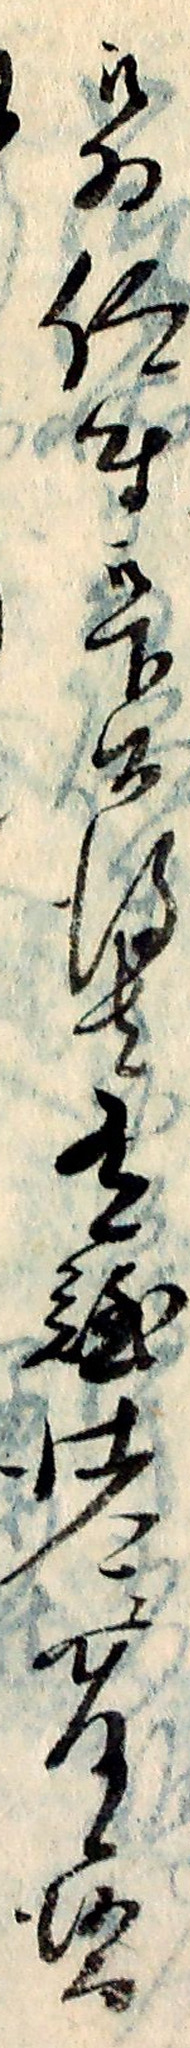被為仰付被下候得は有難仕合に奉存候仍て
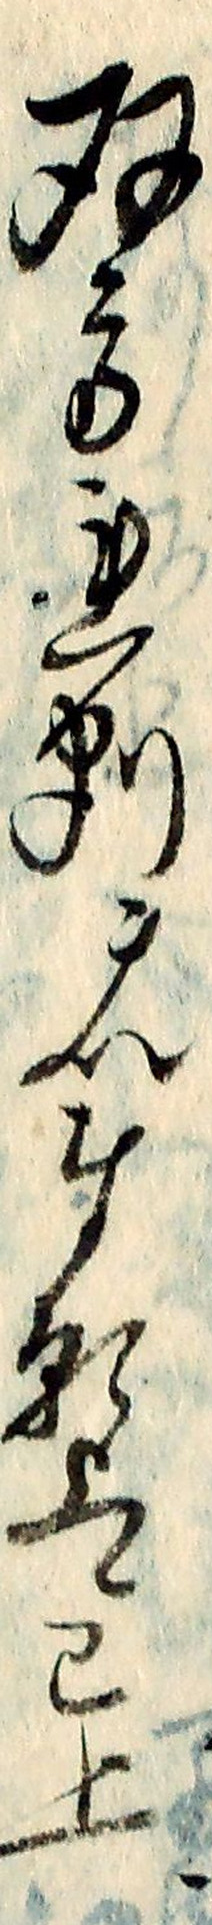双方連判を以奉願上候已上
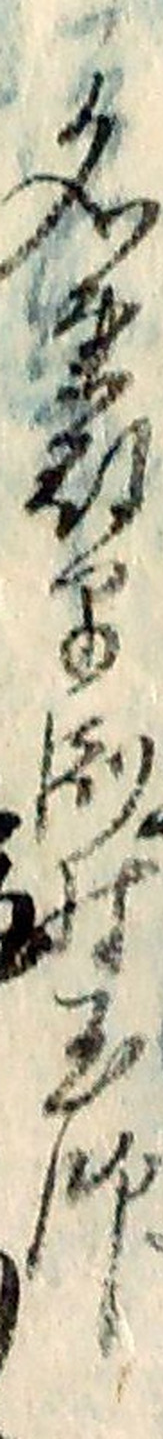名東郡早淵村玉師
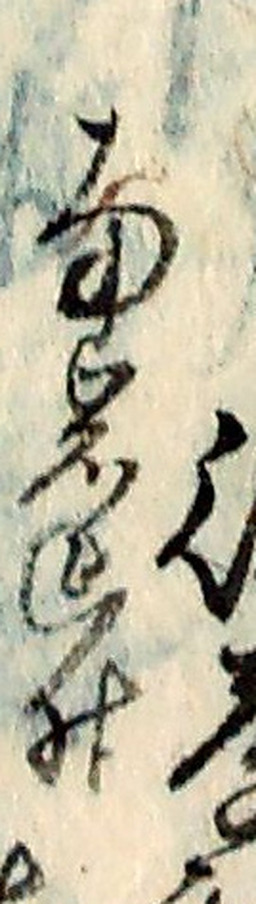南岩延村
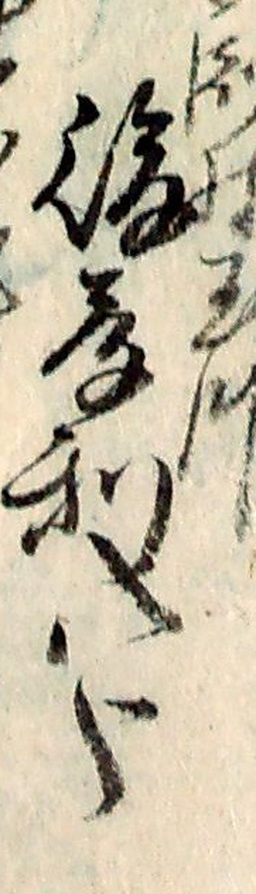後藤利八郎
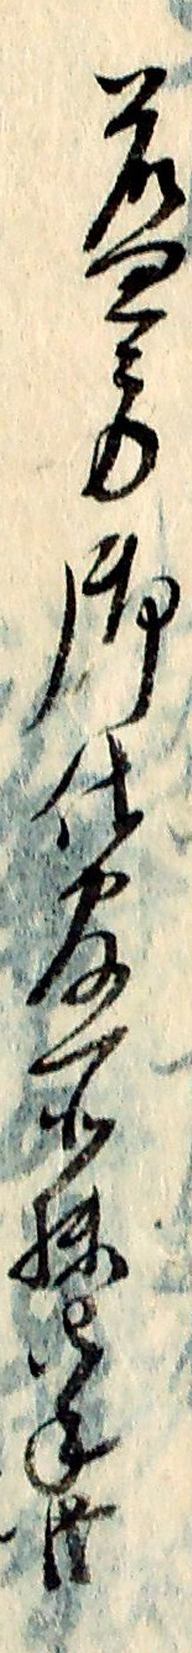藍方御代官所様御手代
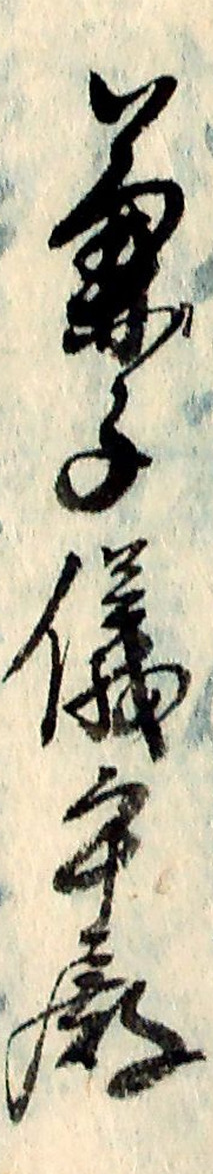兼子儀平殿
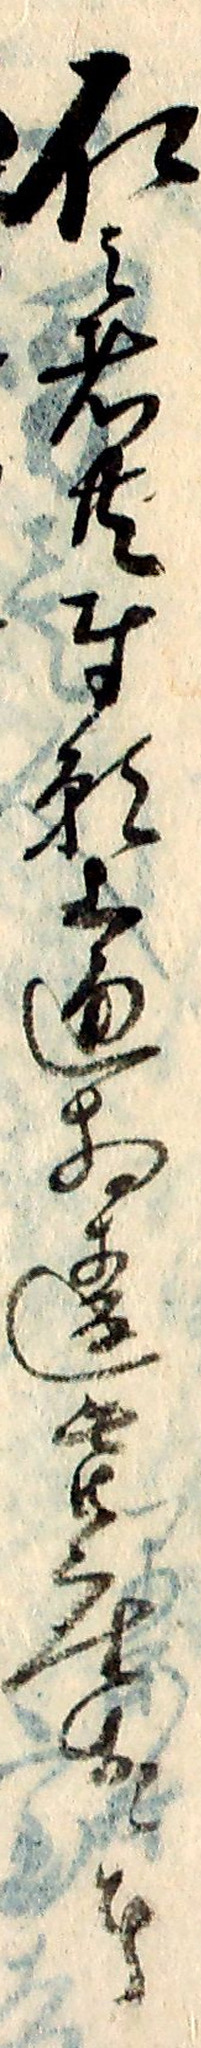右之者共奉願上通相違無御座候に付
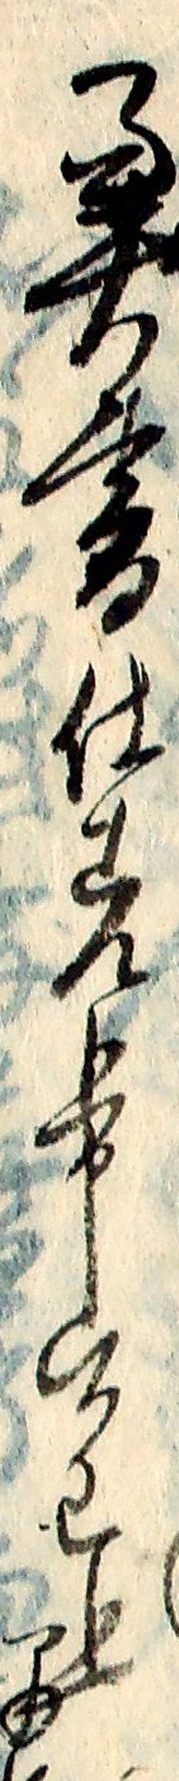奥書仕差上申候已上
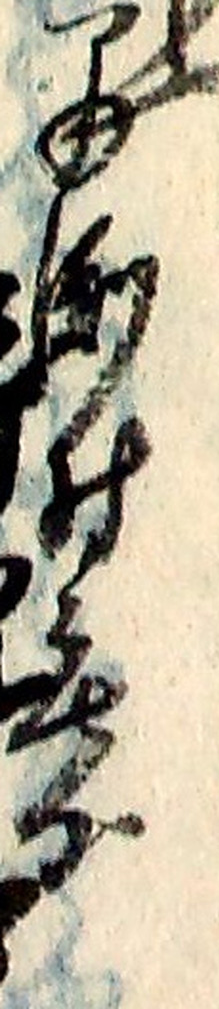早淵村庄屋
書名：諸御願書控(後藤氏壱番）
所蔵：鳴門教育大学 Naruto University of Education
